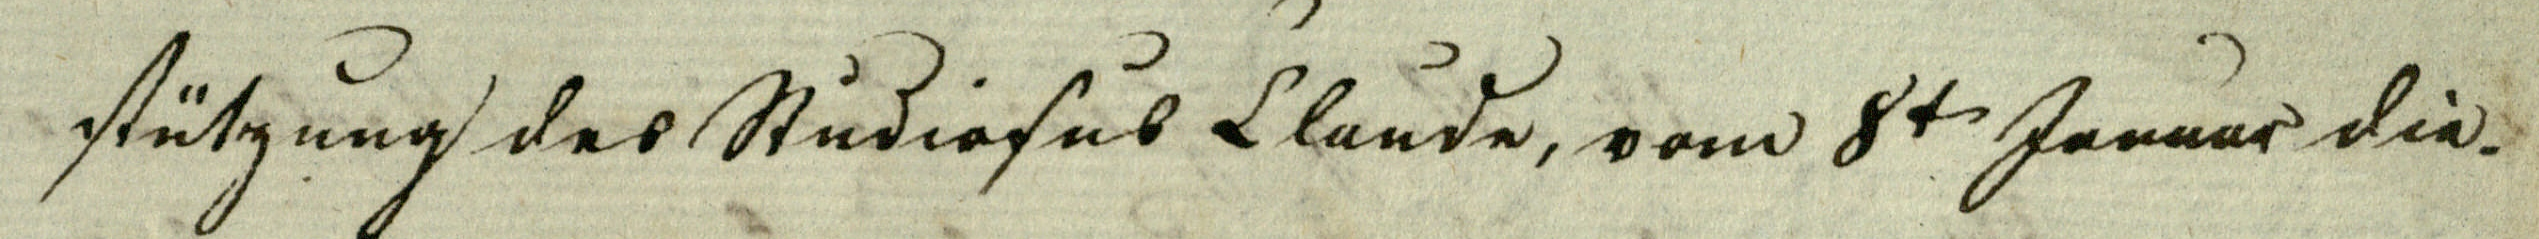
stützung des Studiosus Claude, vom 8ten Januar die¬
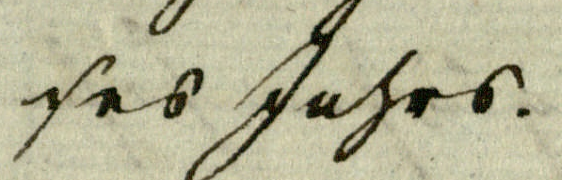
ses Jahres.
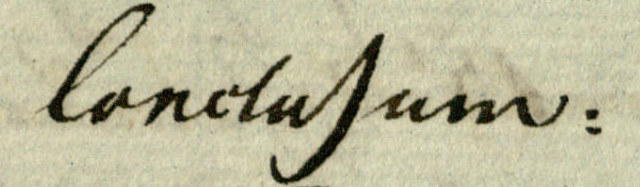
Conclusum:
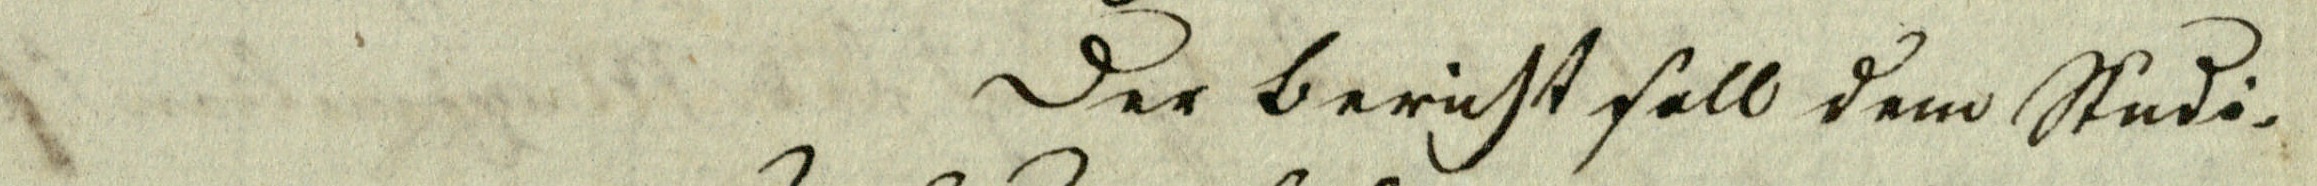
Der Bericht soll dem Studi¬
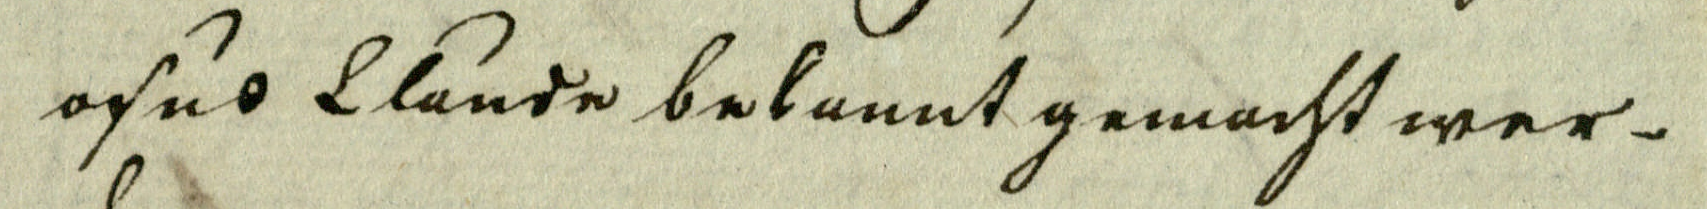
osus Claude bekannt gemacht wer¬
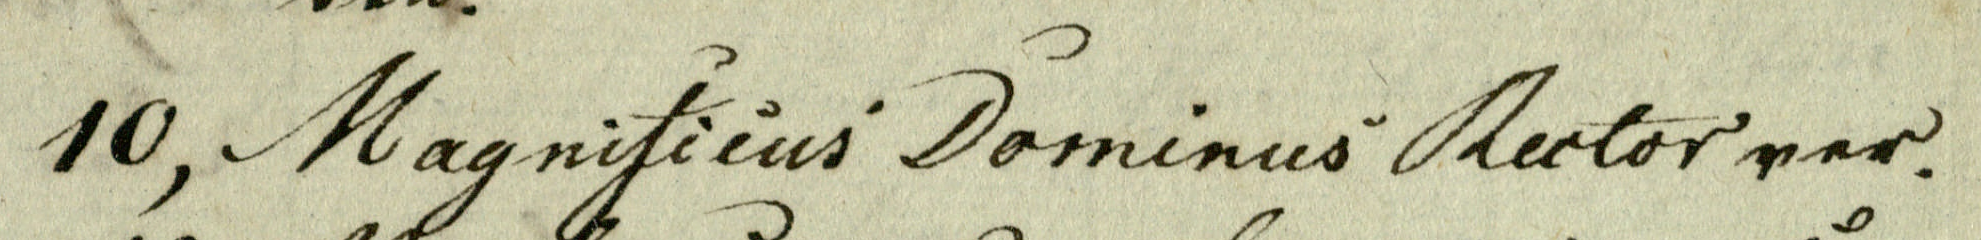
10, Magnificus Dominus Rector ver¬
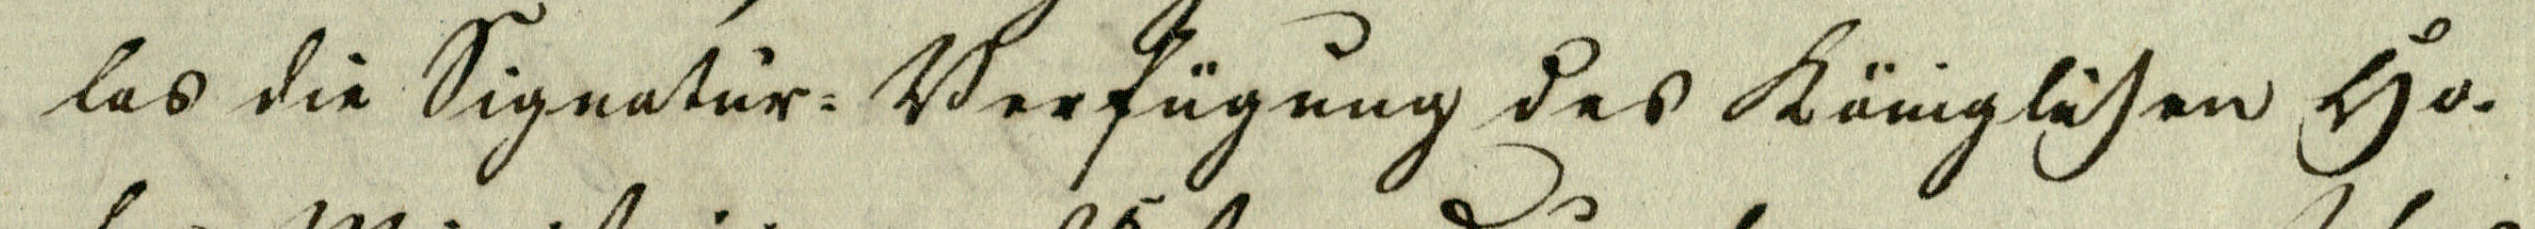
las die Signatur-Verfügung des Königlichen Ho¬
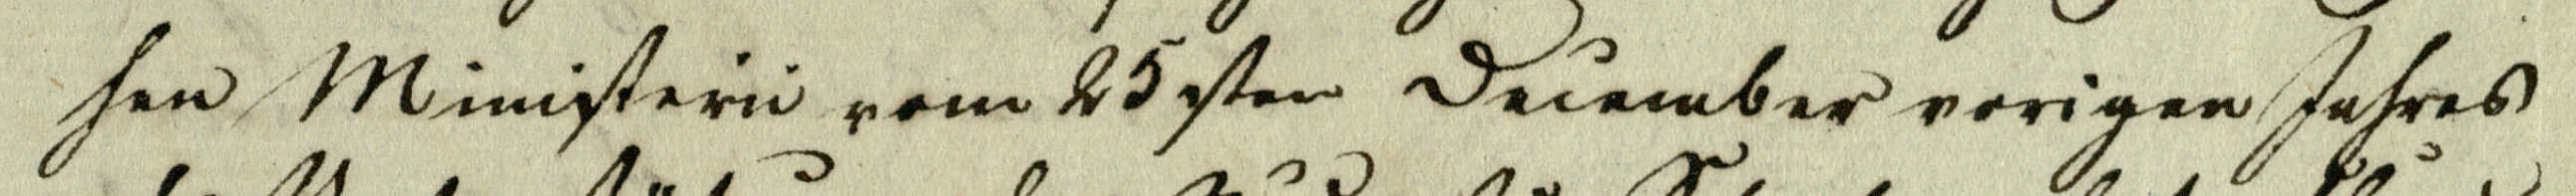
hen Ministerii vom 25sten December vorigen Jahres
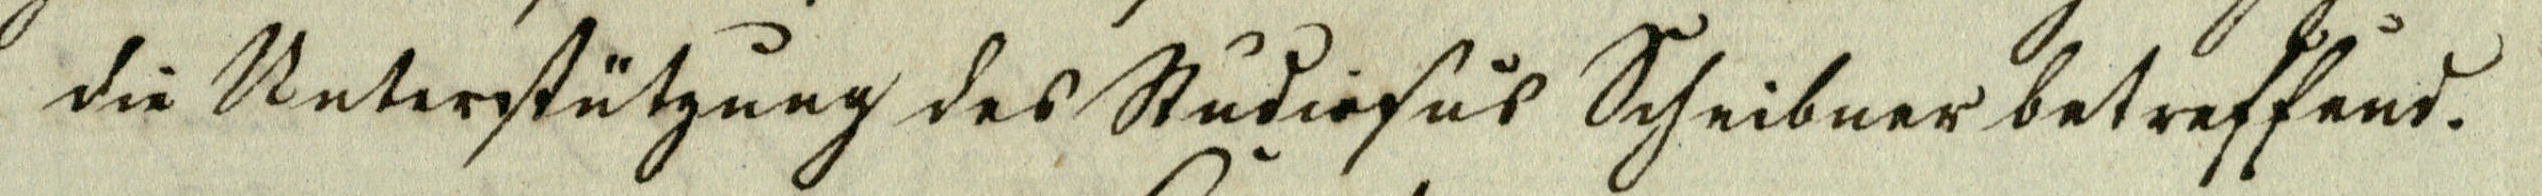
die Unterstützung des Studiosus Scheibner betreffend.
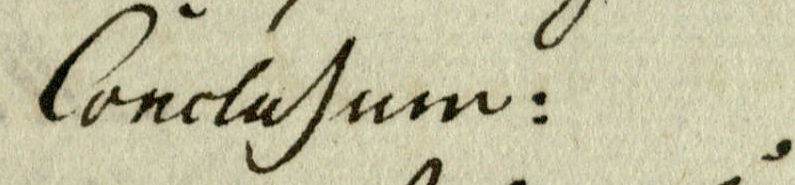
Conclusum:
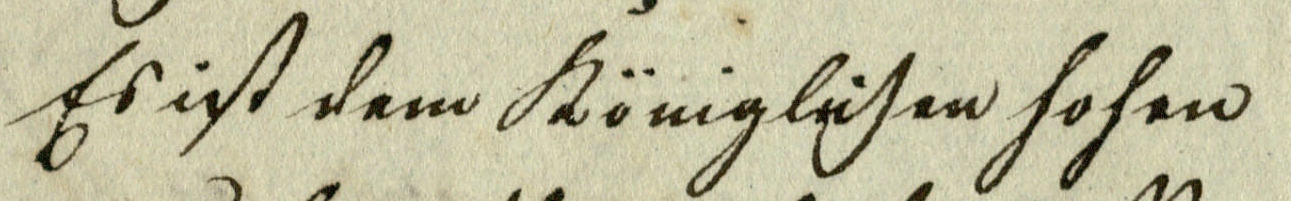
Es ist dem Königlichen hohen
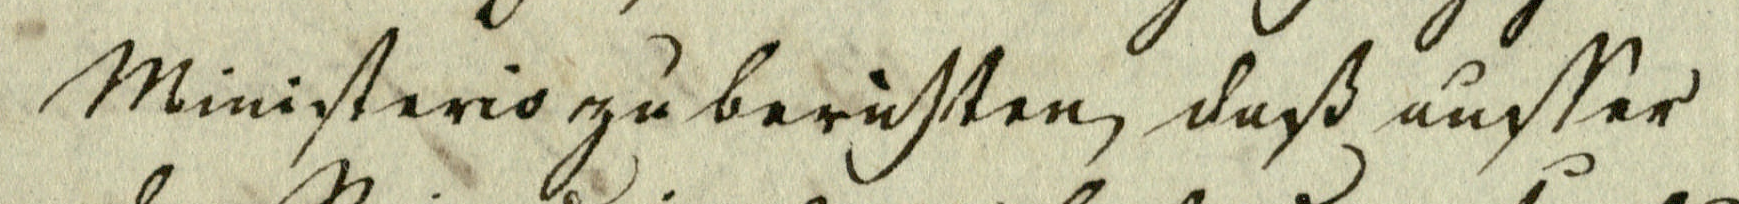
Ministerio zu berichten, daß ausser
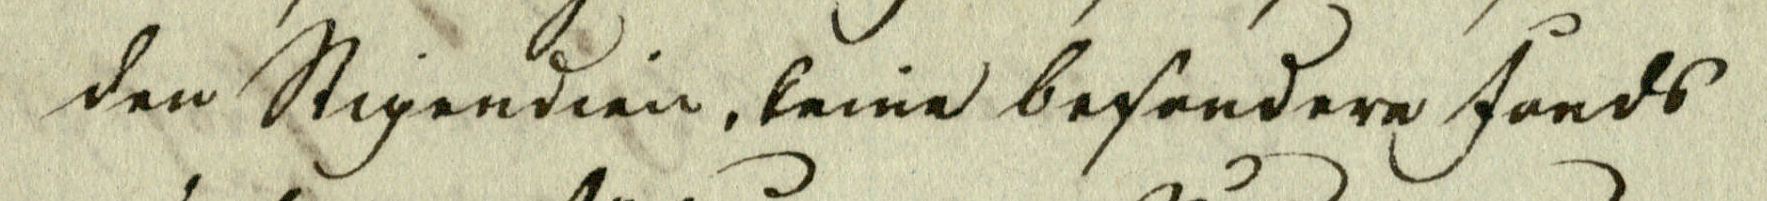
den Stipendien, keine besondern Fonds
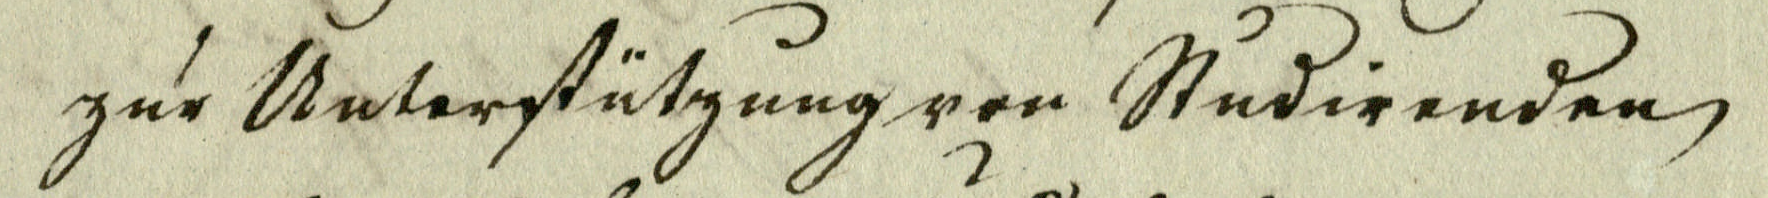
zur Unterstützung von Studirenden
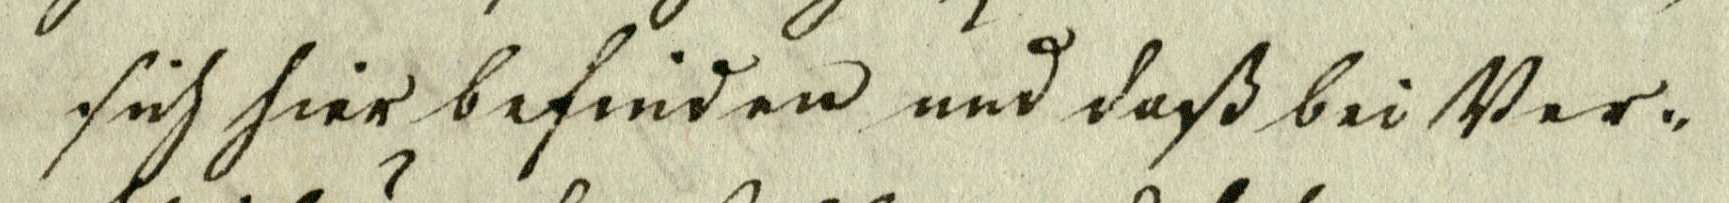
sich hier befinden und daß bei Ver¬
